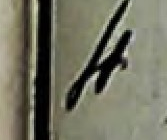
4
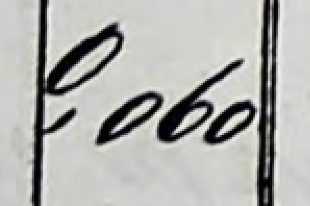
0,060
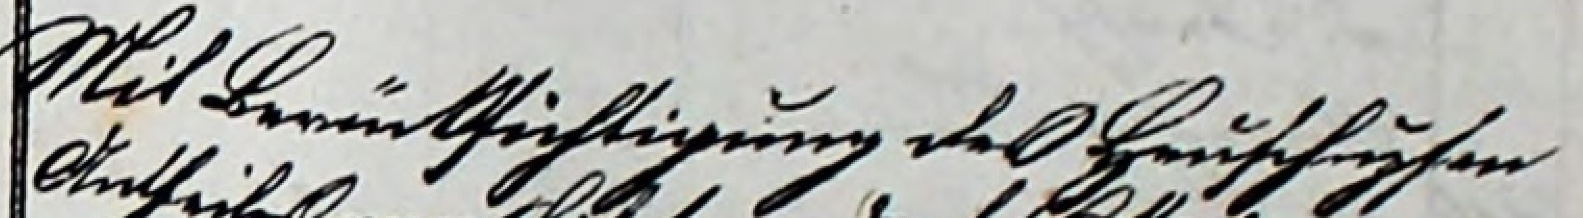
Mit Berücksichtigung des Hauschupfen
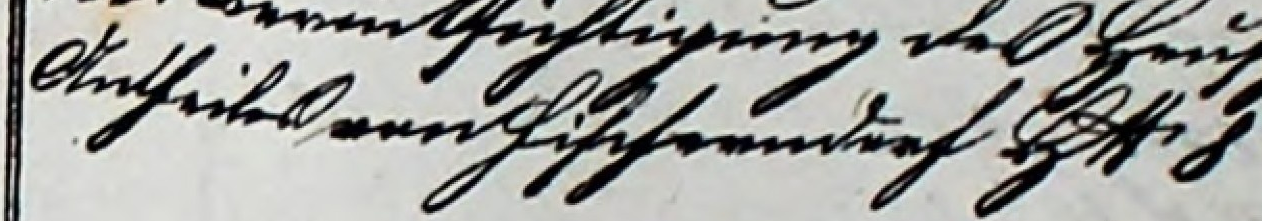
Antheiles von Fischerndorf H? 8
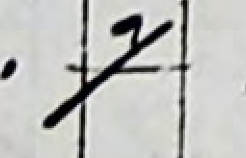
7
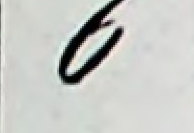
6
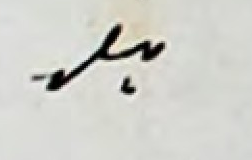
do
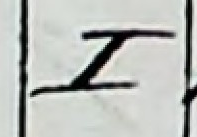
I
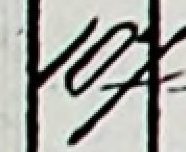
107
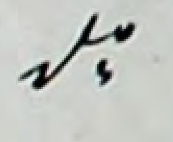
do
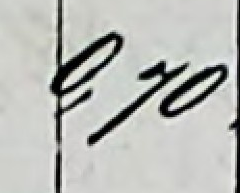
0,70
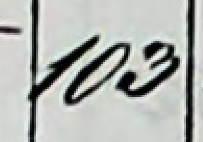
103
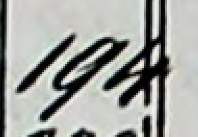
194
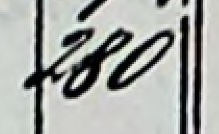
280
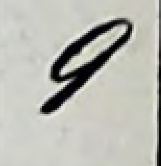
9
